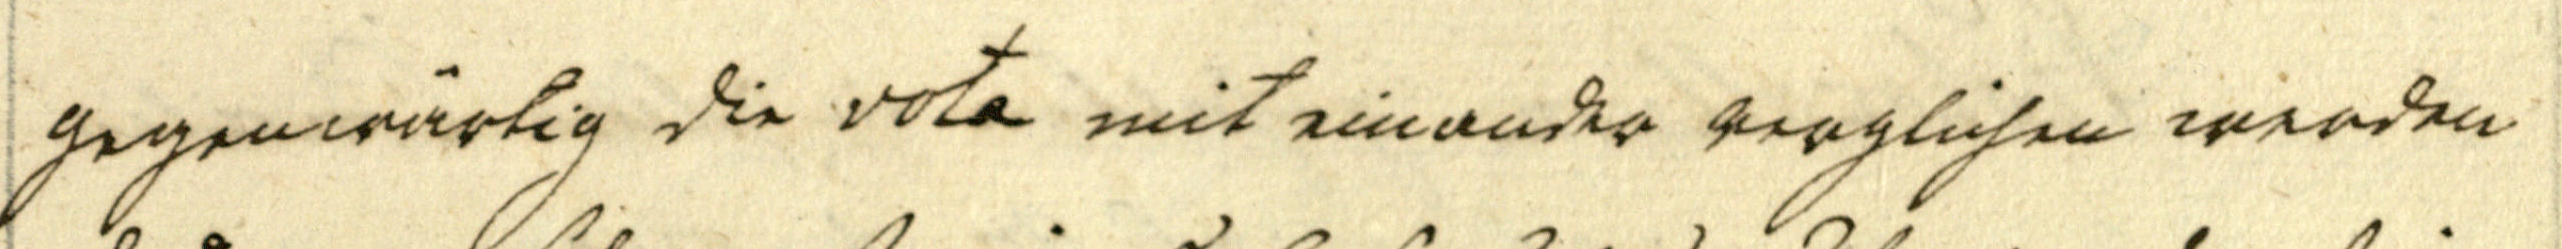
gegenwärtig die vota mit einander verglichen werden
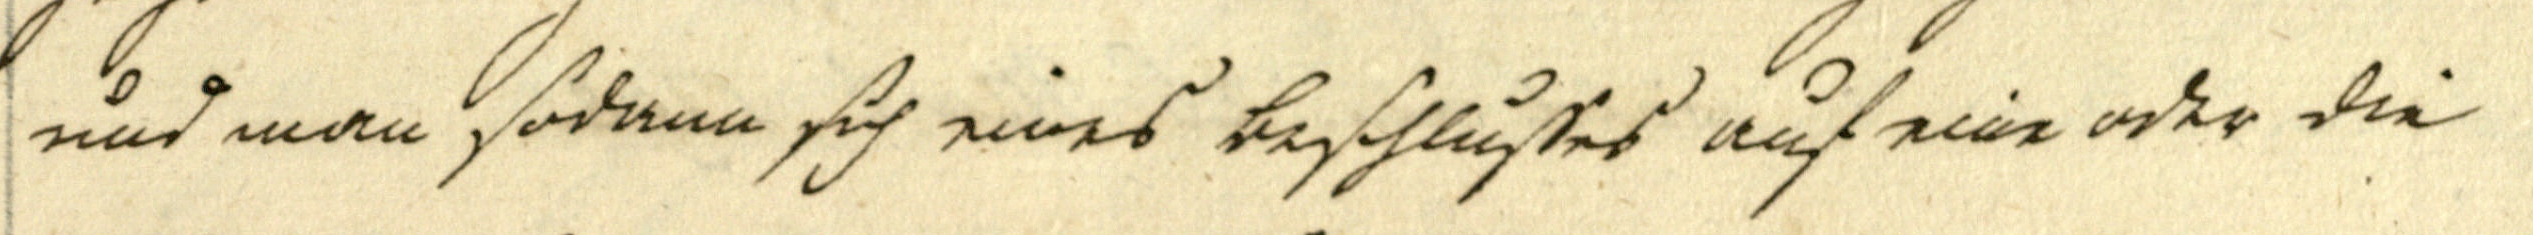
und man sodann sich eines Beschlusses auf eine oder die
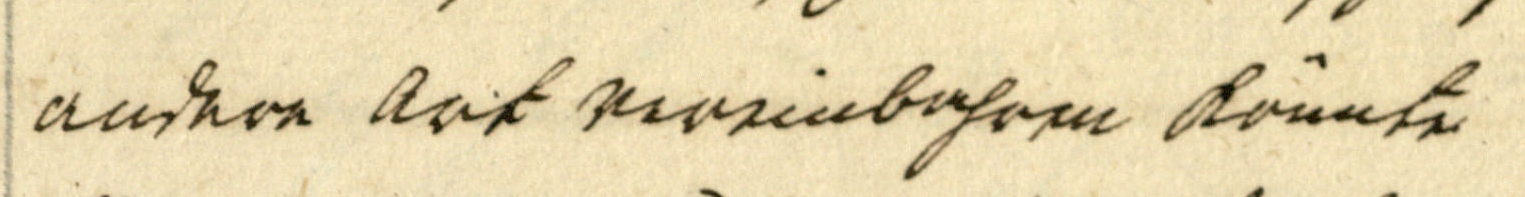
andere Art vereinbahren könnte.
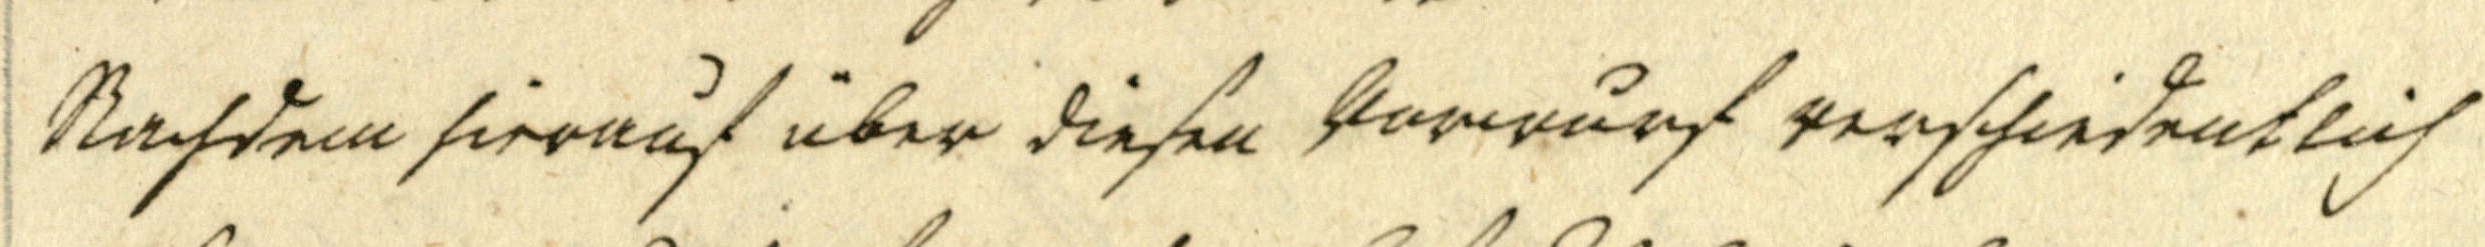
Nachdem hierauf über diesen Vorwurf verschiedentlich
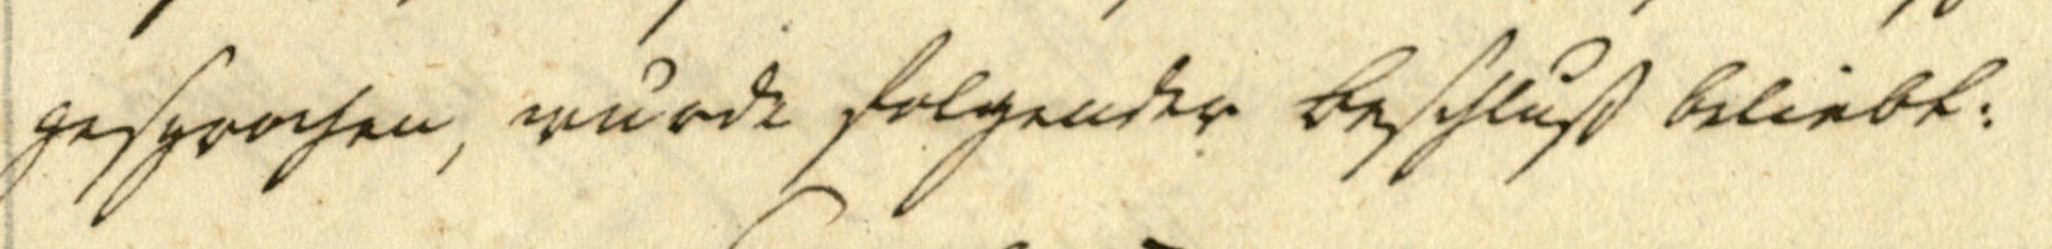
gesprochen, wurde folgender Beschluß beliebt:
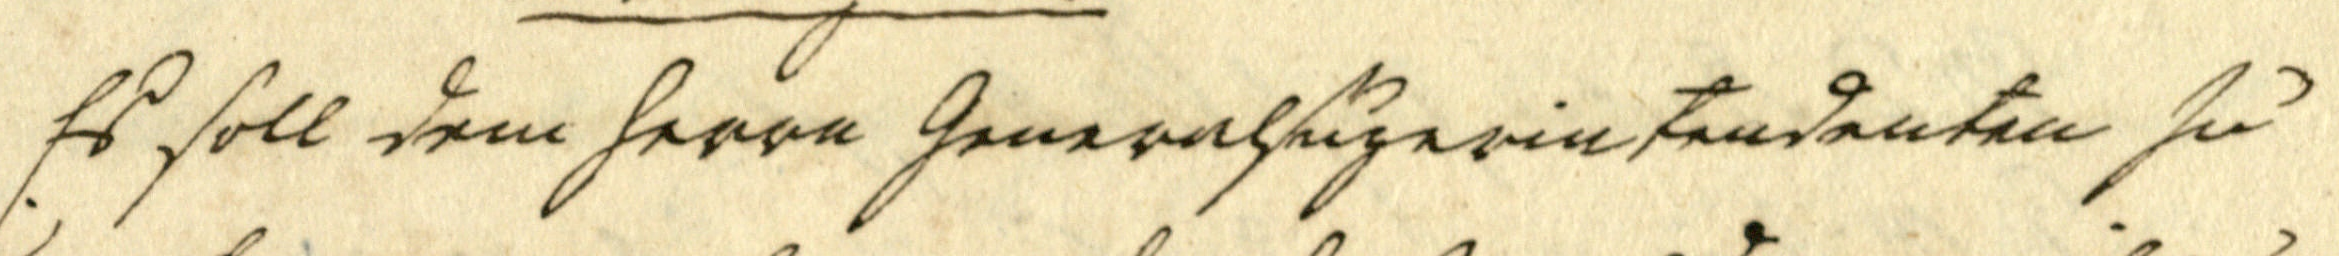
Es soll dem Herrn Generalsuperintendenten zu
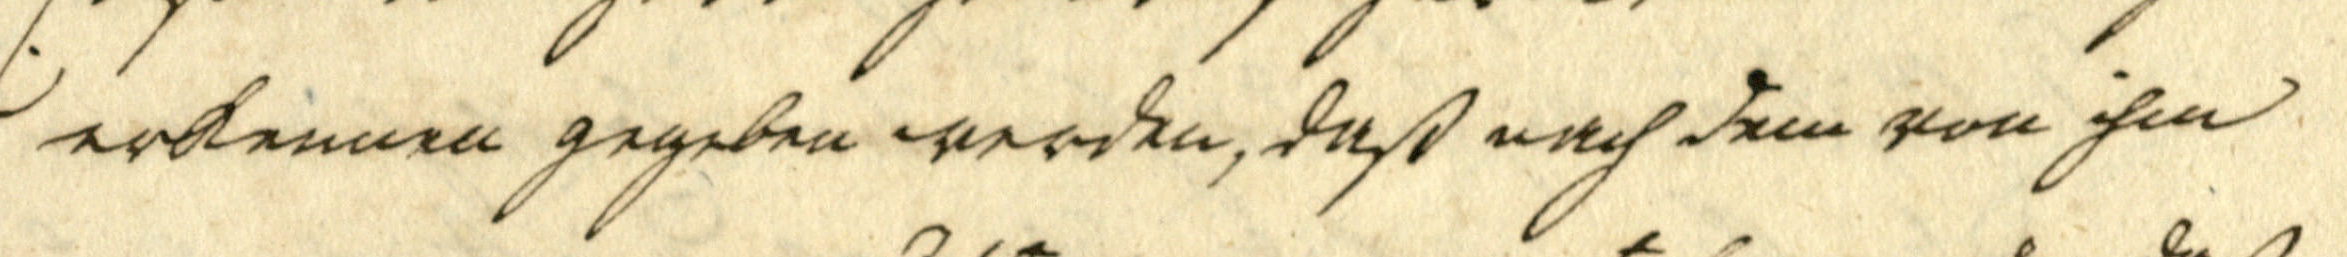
erkennen gegeben werden, daß nach dem von ihm
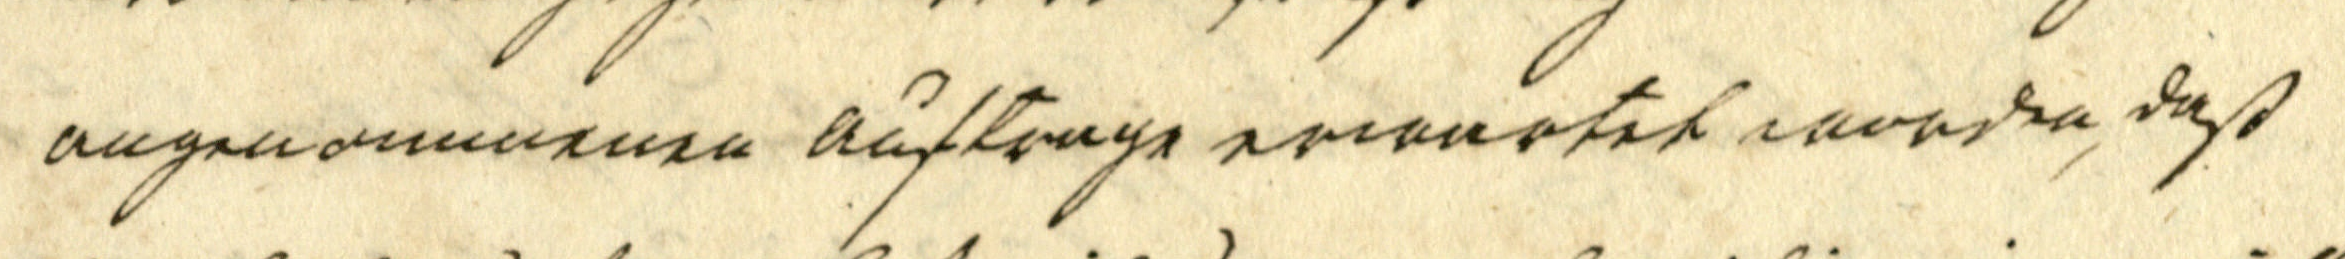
angenommenen Auftrage erwartet worden, daß
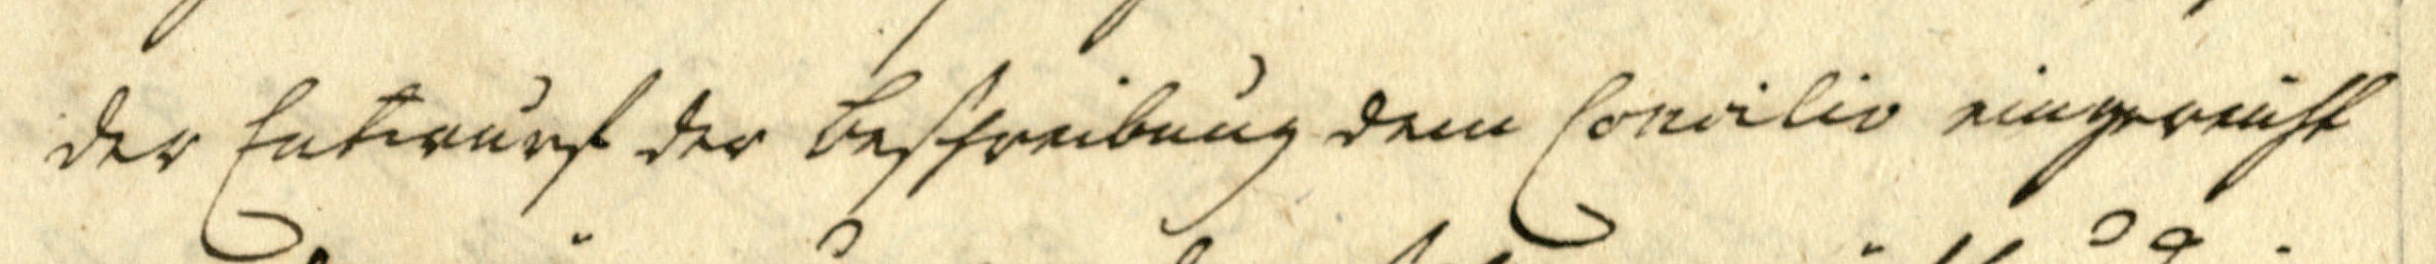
der Entwurf der Beschreibung dem Concilio eingereicht
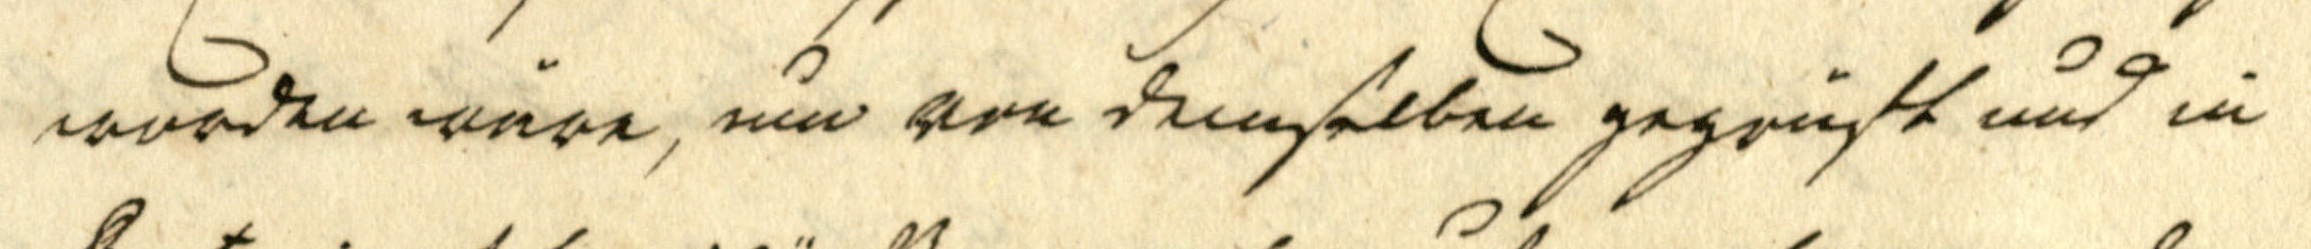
worden wäre, um von demselben geprüft und in
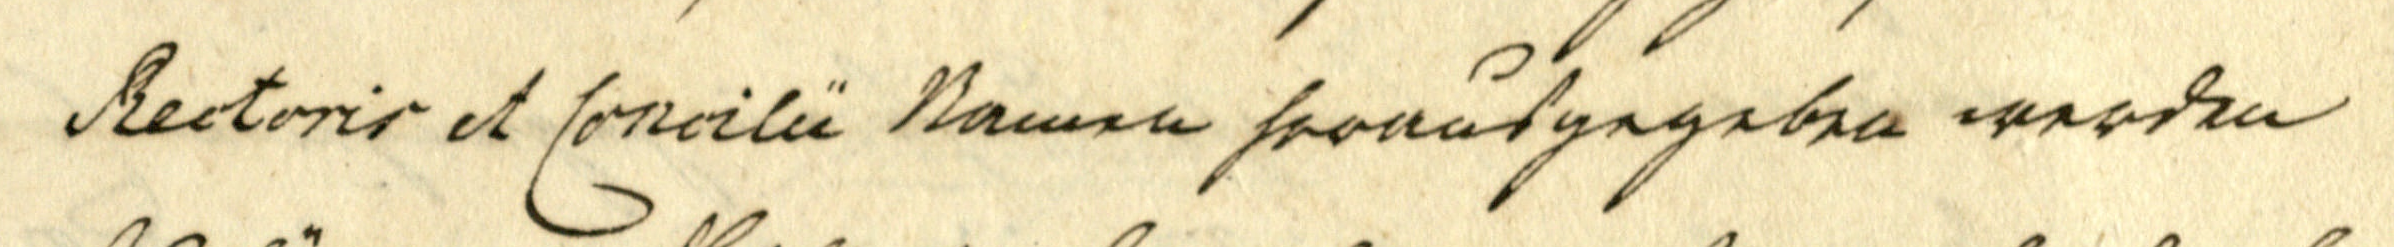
Rectoris et Concilii Namen herausgegeben werden
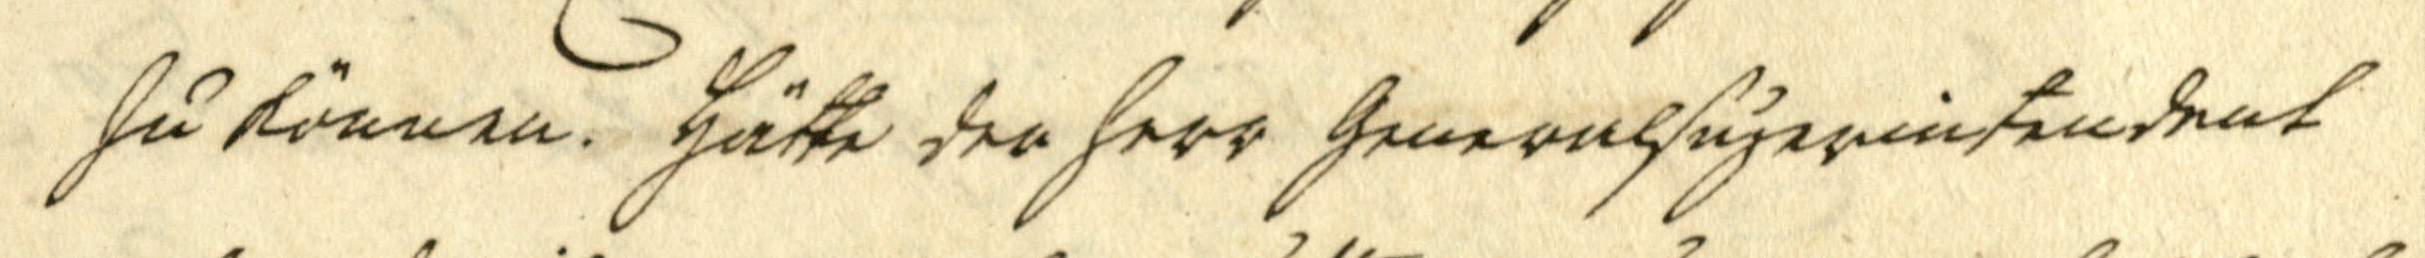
zu können. Hätte der Herr Generalsuperintendent
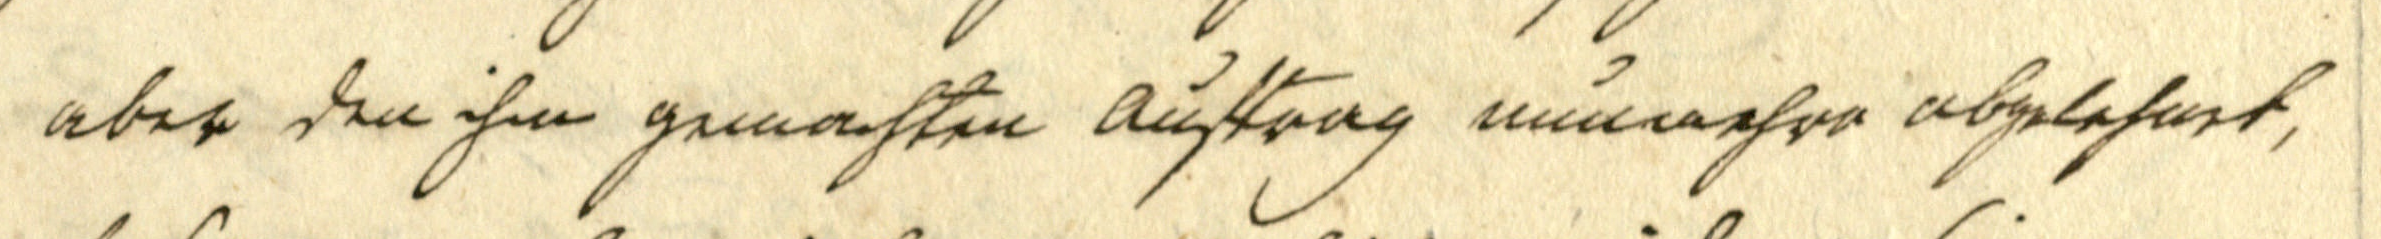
aber den ihm gemachten Auftrag nunmehro abgelehnet,
